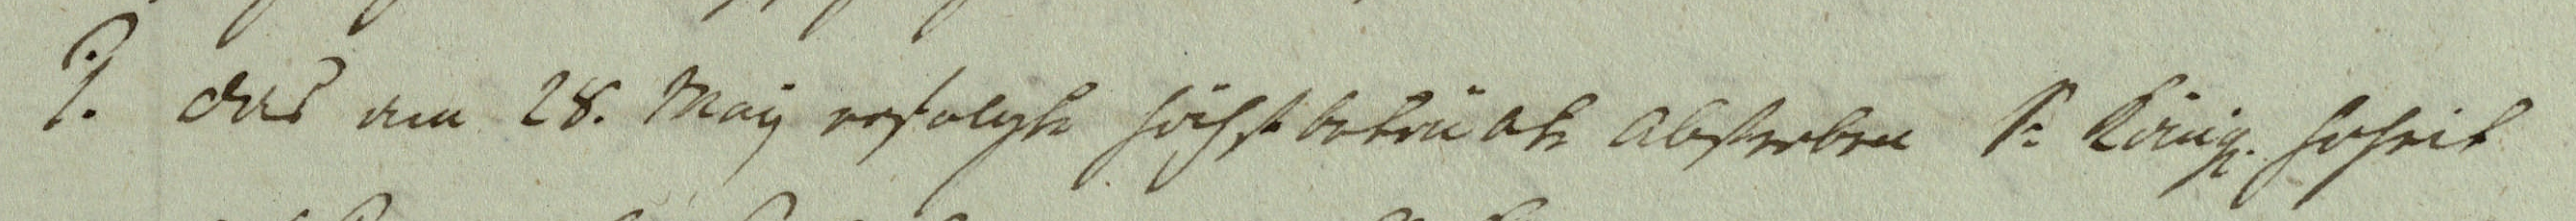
1. das am 28. Maÿ erfolgte höchstbetrübte Absterben Sr. Königl. hoheit
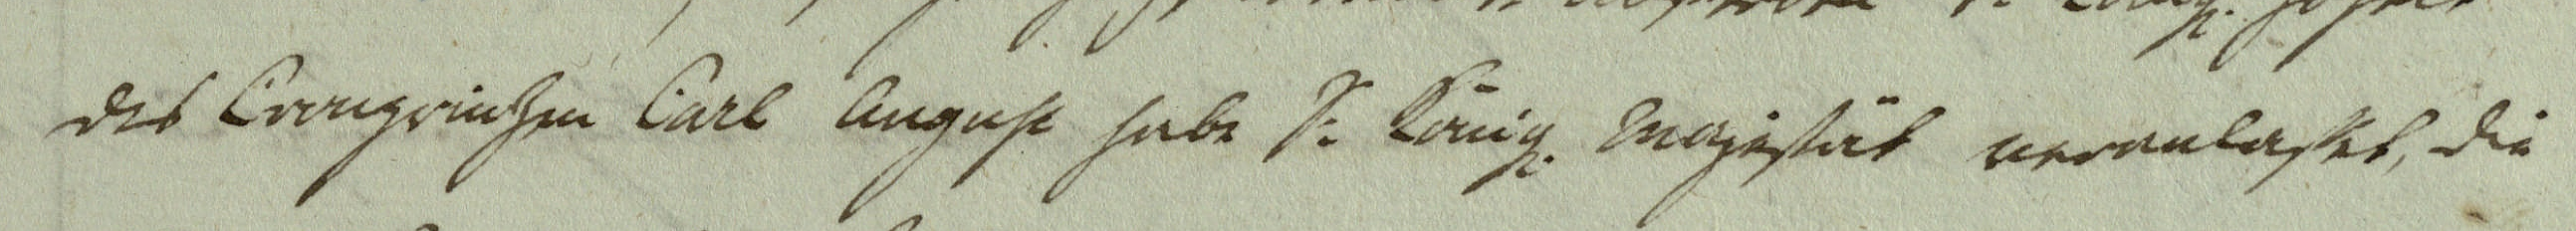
des Cronprinzen Carl August habe Sr. Königl. Majestät veranlasset, die
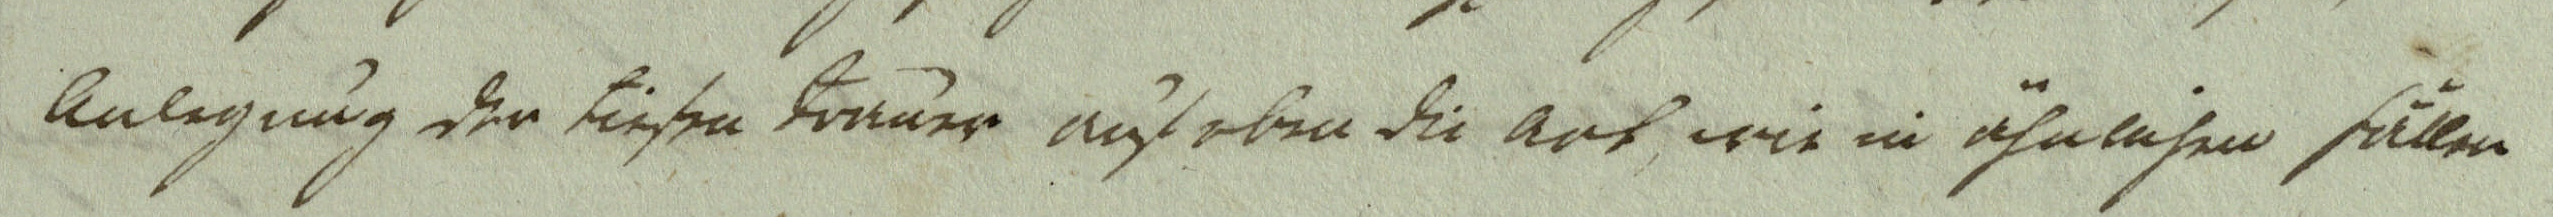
Anlegung der tiefen Trauer auf eben die Art, wie in ähnlichen Fällen
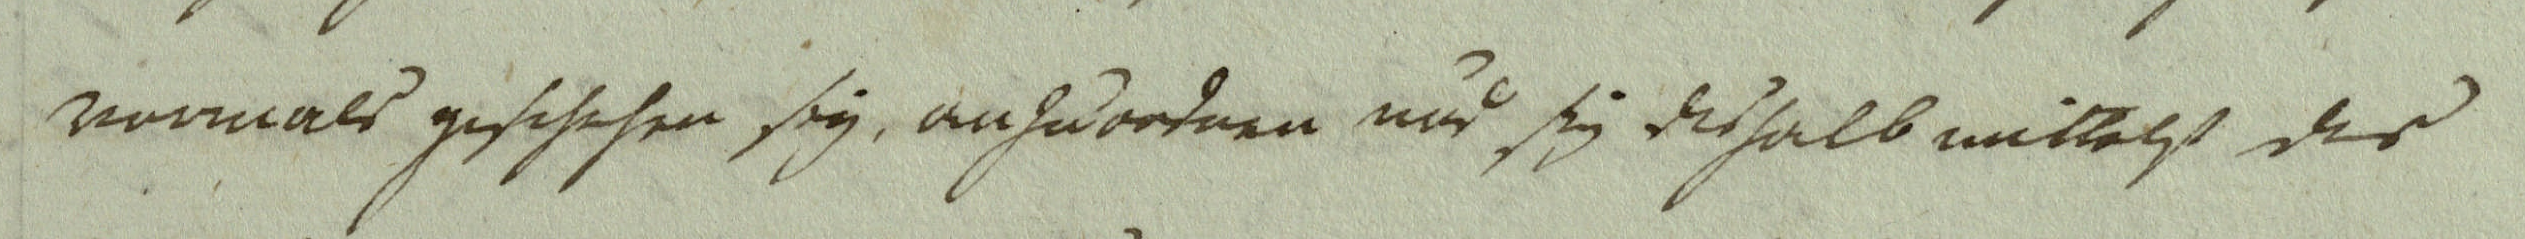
vormals geschehen seÿ, anzuordnen und seÿ deshalb mittelst des
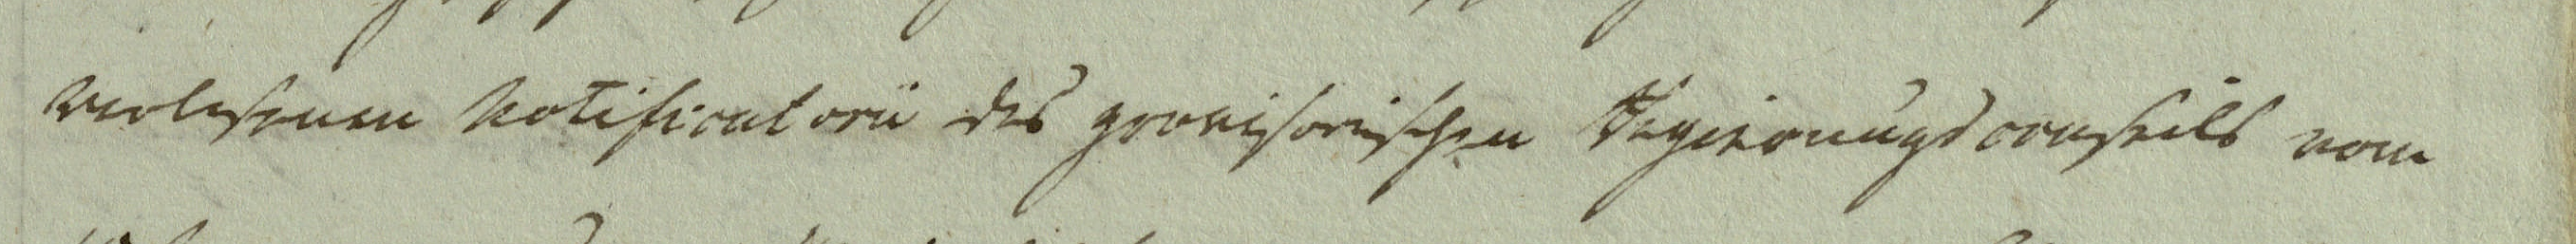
verlesenen Notificatorii des provisorischen Regierungs conseils vom
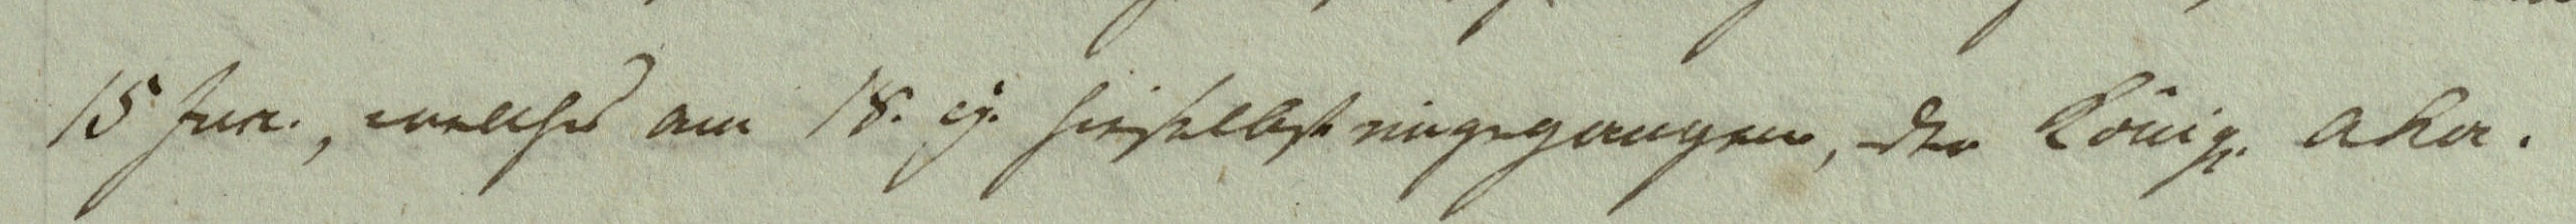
15. Jun., welche am 18. ej. hieselbst eingegangen, der Königl. Aka¬
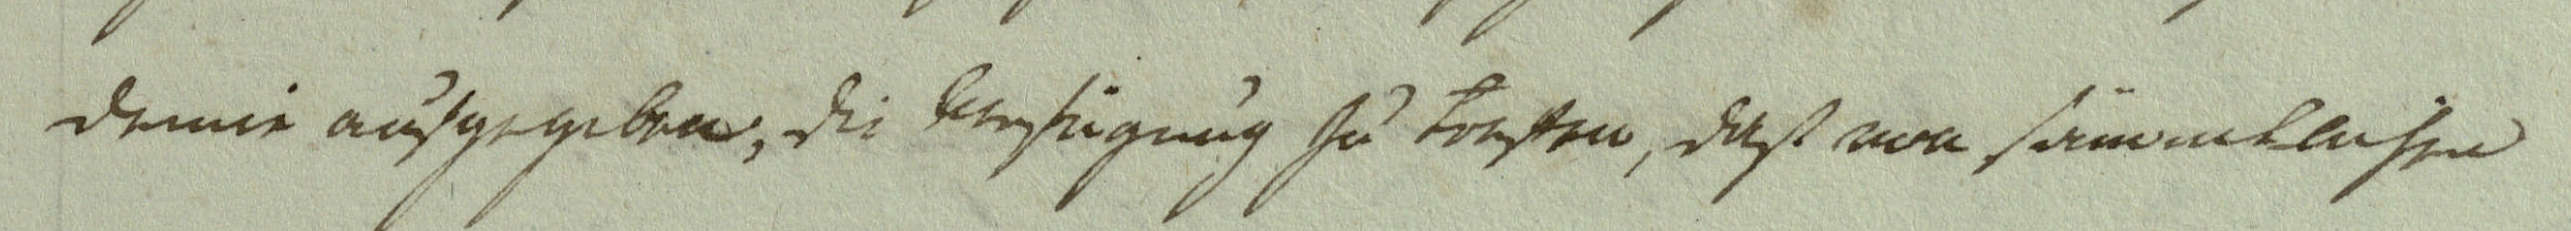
demie aufgegeben, die Verfügung zu treffen, daß von sämmtlichen
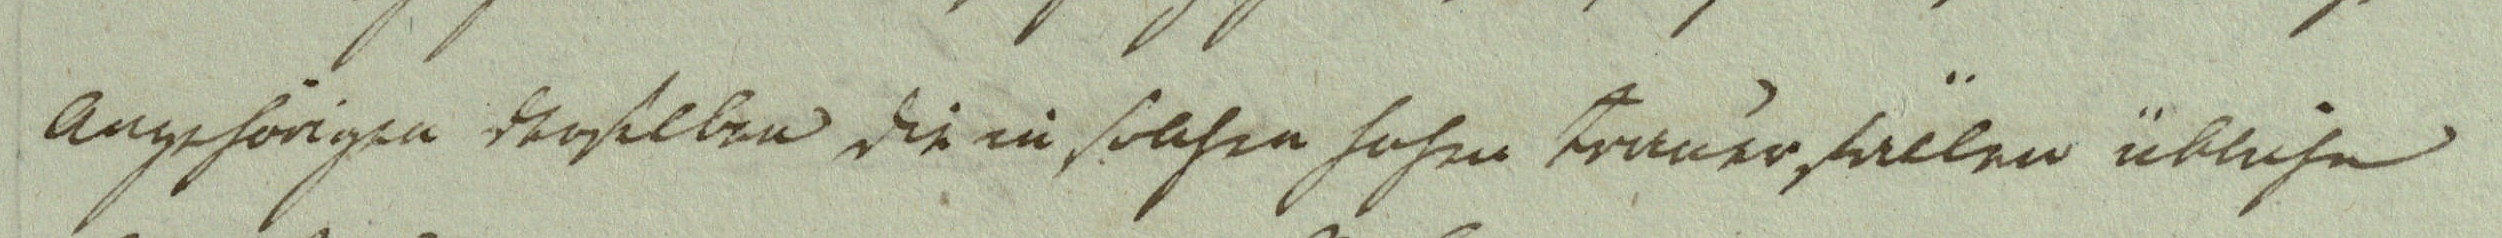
Angehörigen derselben die in solchen hohen Trauerfällen übliche
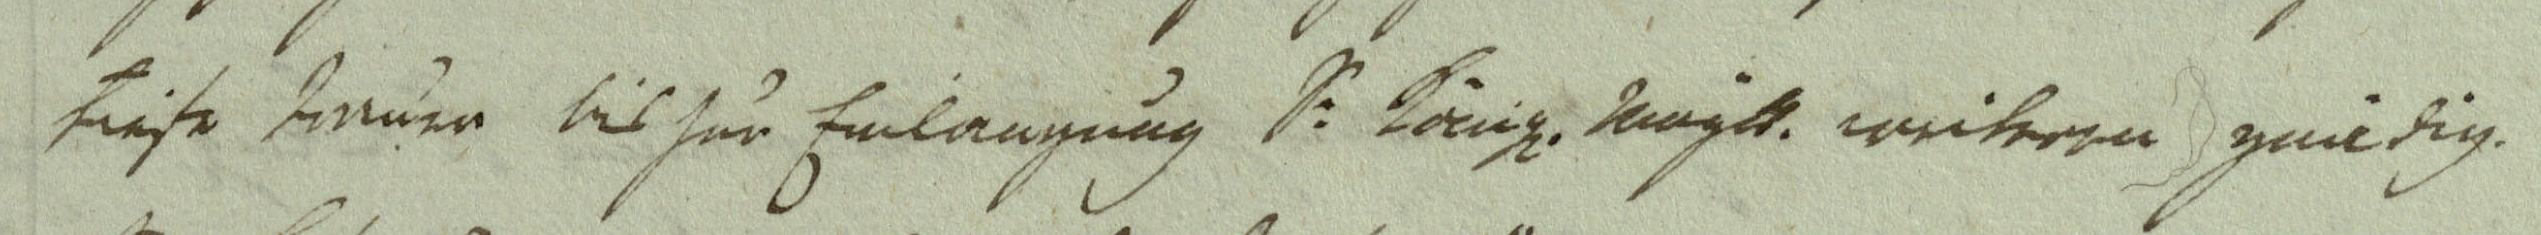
tiefe Trauer bis zur Erlangung Sr. Königl. Maÿtt. weiteren gnädig¬
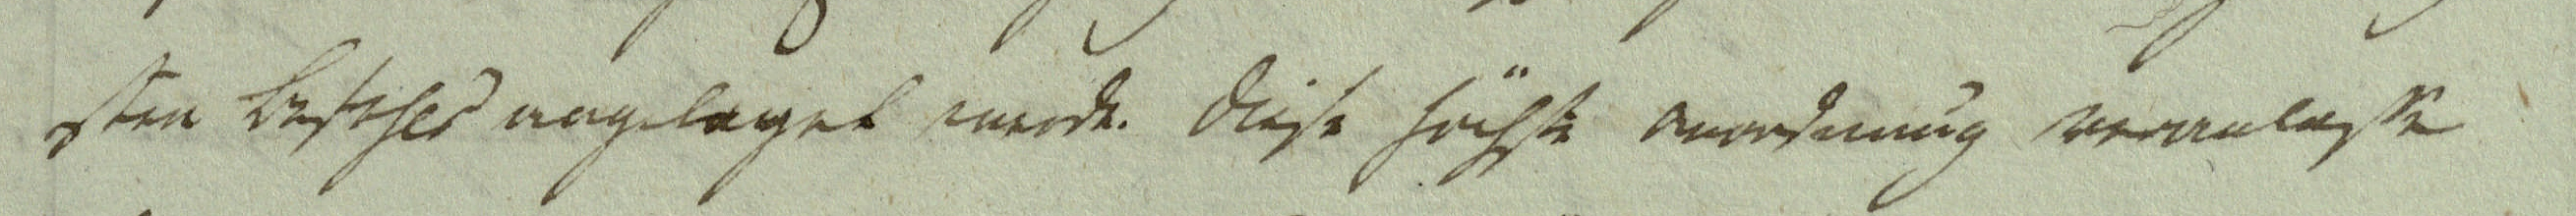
sten Befehls angeleget werde. Diese höchste Anordnung veranlasse
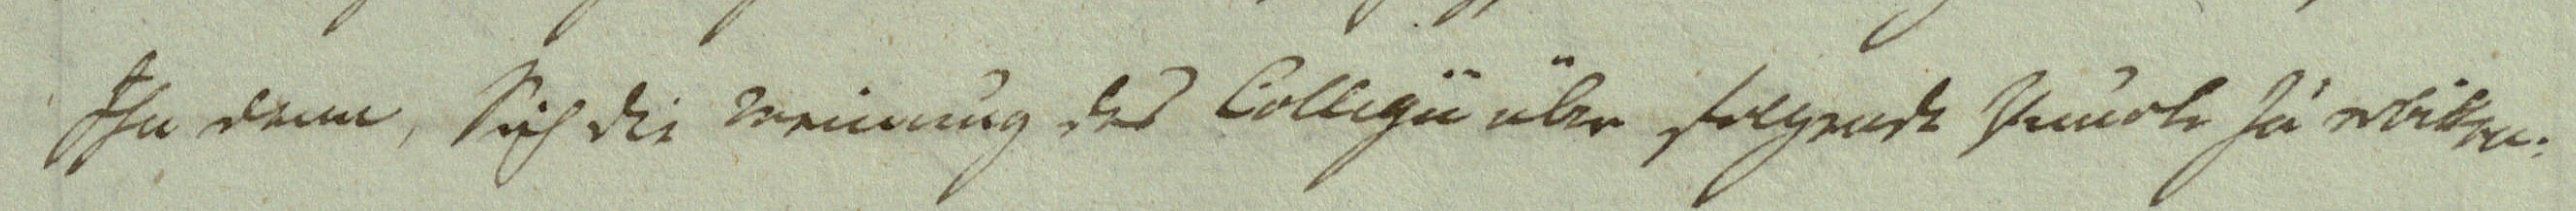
Ihn denn, Sich die Meinung des Collegii über folgende Puncte zu erbitten:
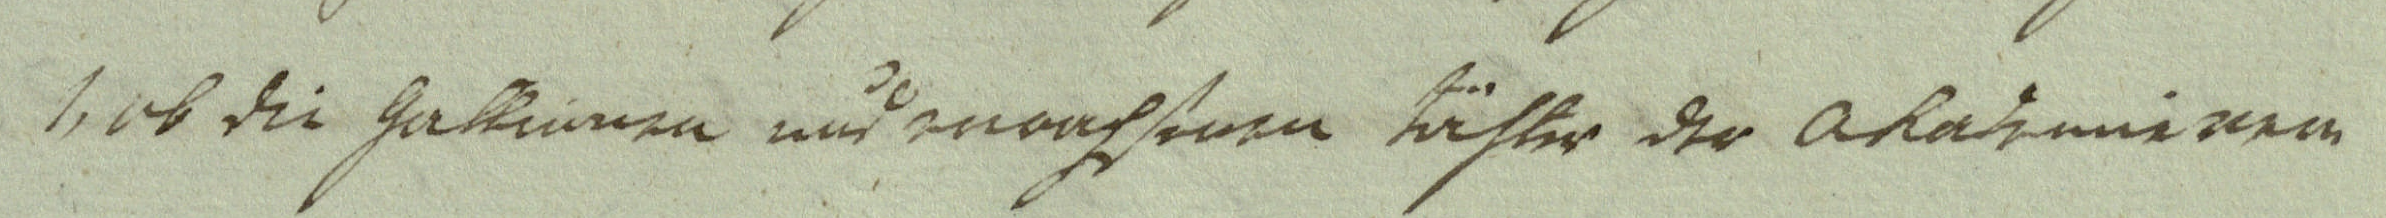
1, ob die Gattinnen und erwachsenen Töchter der Akademiever¬
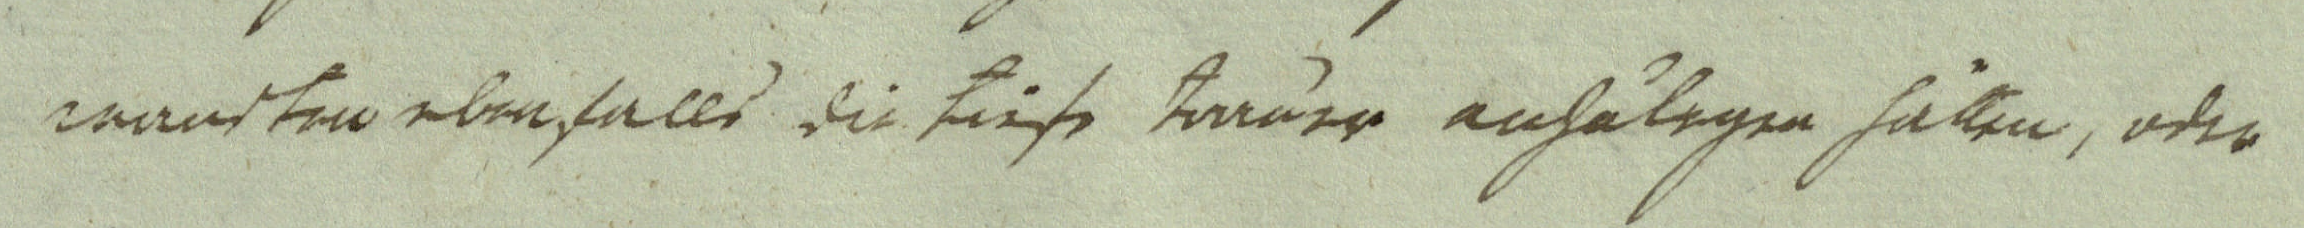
wandten ebenfalls die tiefee Trauer anzulegen hätten, oder
